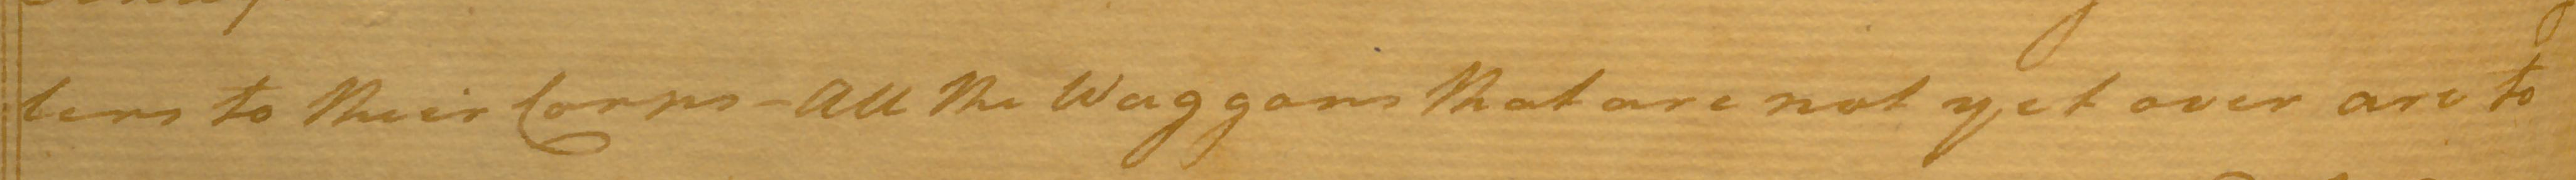lers to their Corps- All the Waggons that are not yet over are to
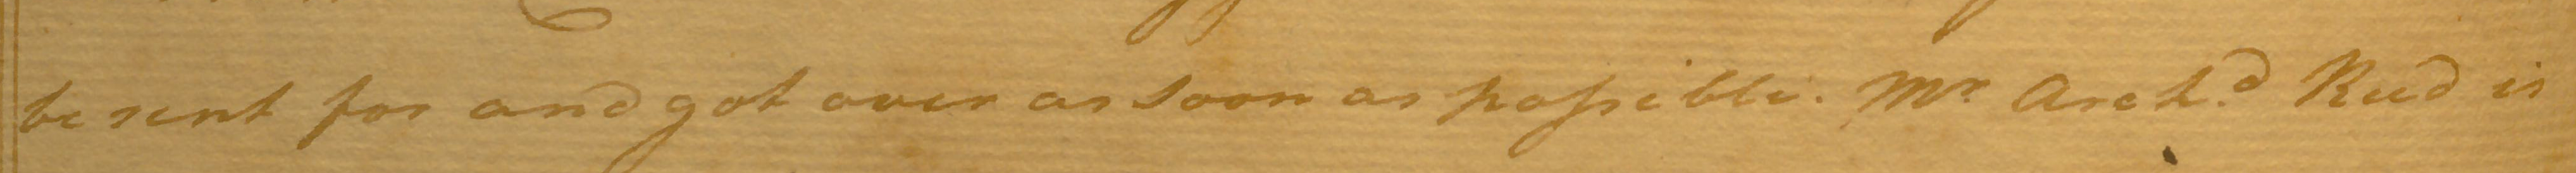be sent for and got over as soon as possible. M^r. Arch^d. Reed is
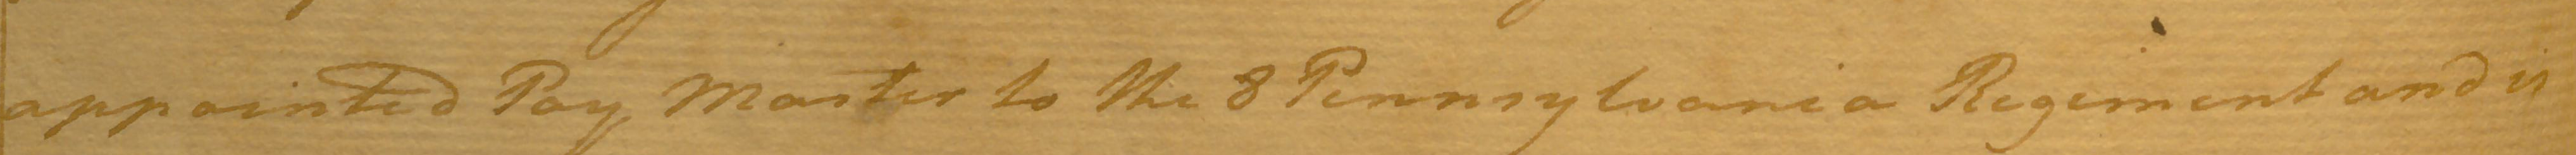appointed Pay Master to the 8 Pennsylvania Regiment and is
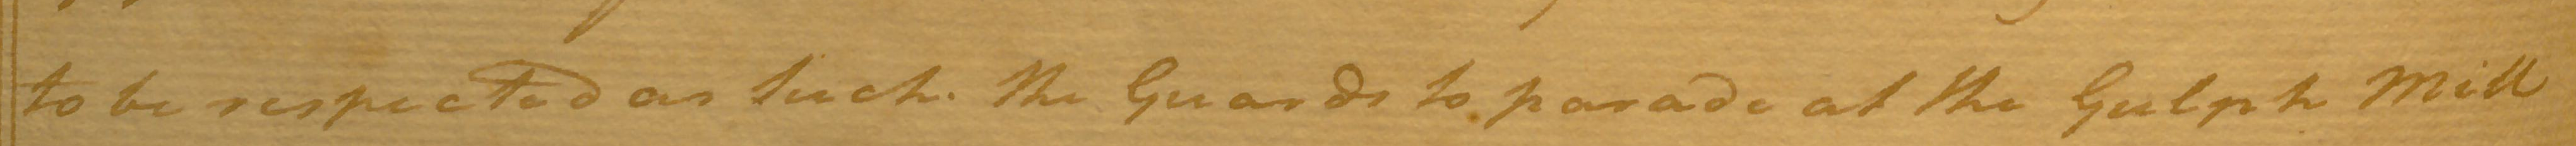to be respected as such. the Guards to parade at the Gulph Mill
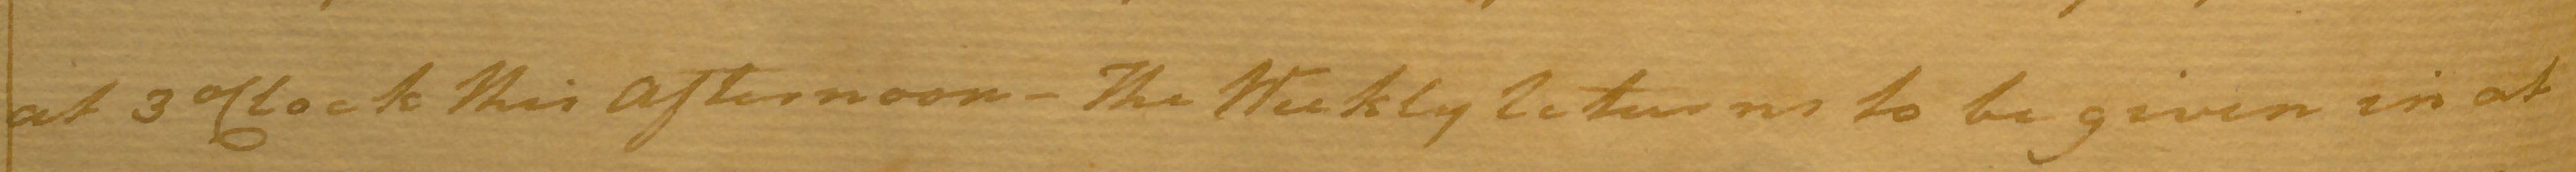at 3 ^oClock this Afternoon- The Weekly returns to be given in at
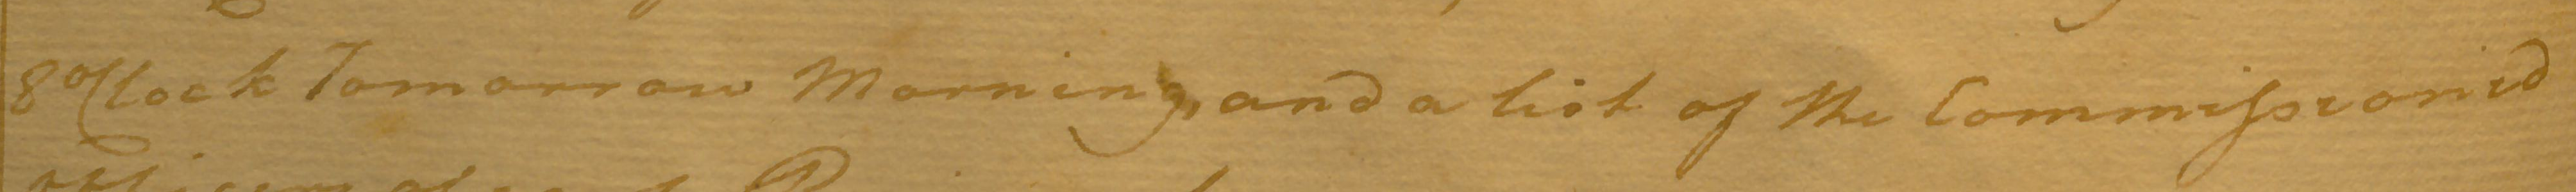8 ^oClock Tomorrow Morning and a list of the Commissioned
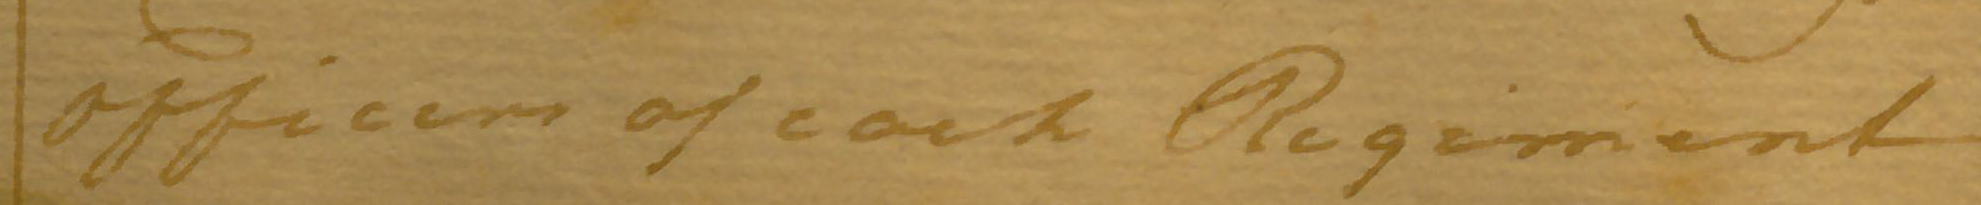officers of each Regiment
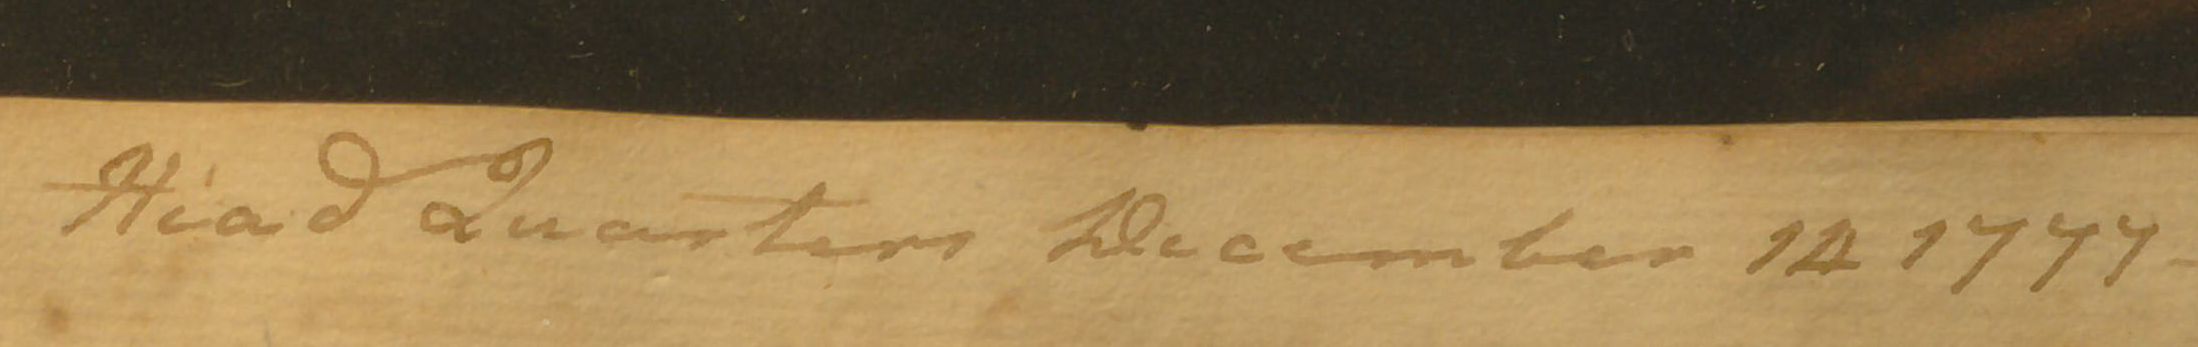Head Quarters December 14 1777-
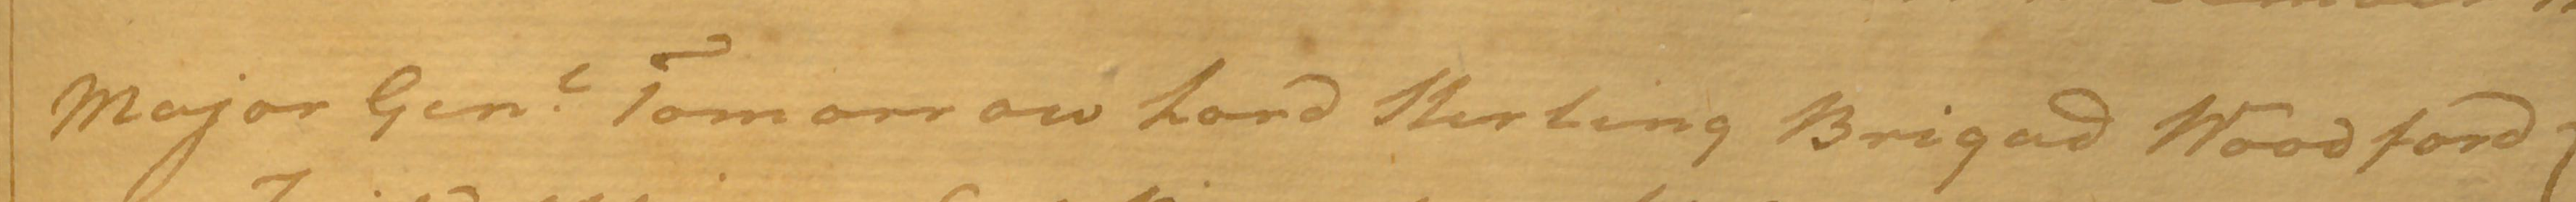Major Gen^l. Tomorrow Lord Sterling Brigad Woodford
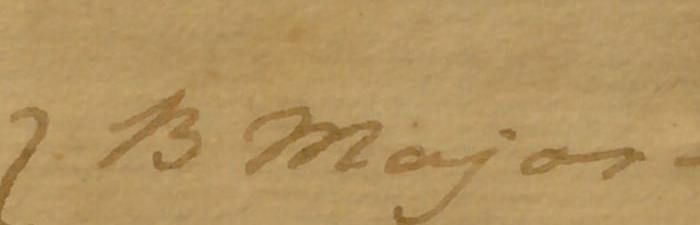B Major
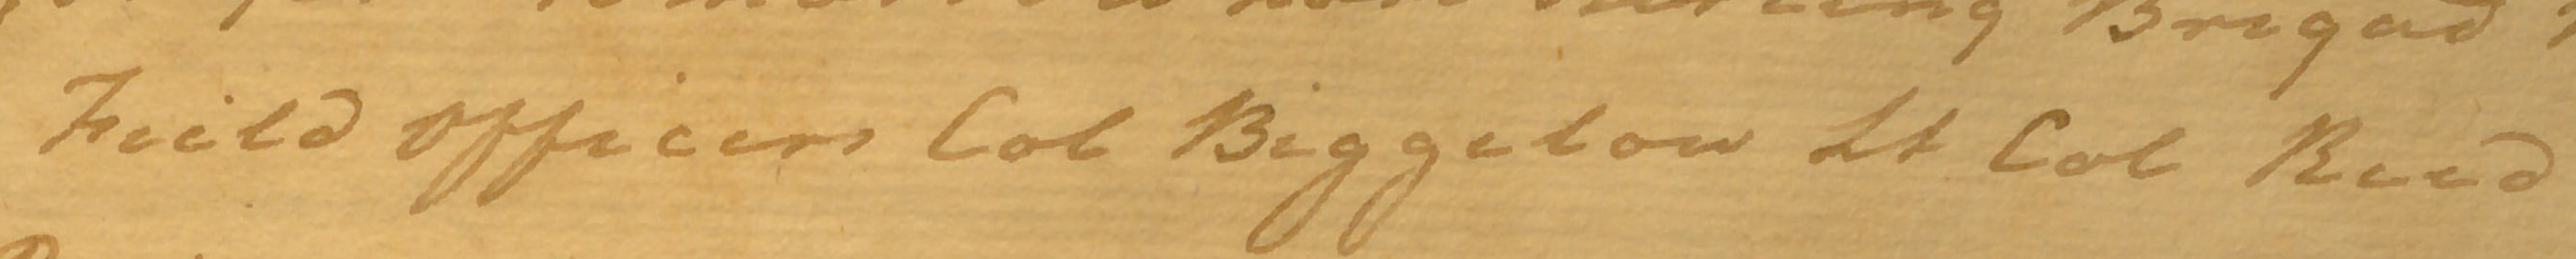Field Officers Col Biggelow Lt Col Reed
